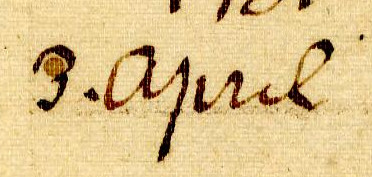3 April
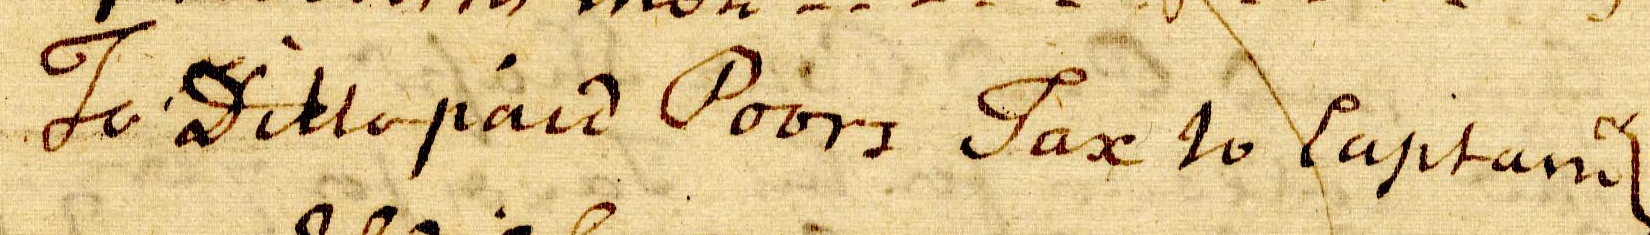To Ditto paid Poors Tax to Captain
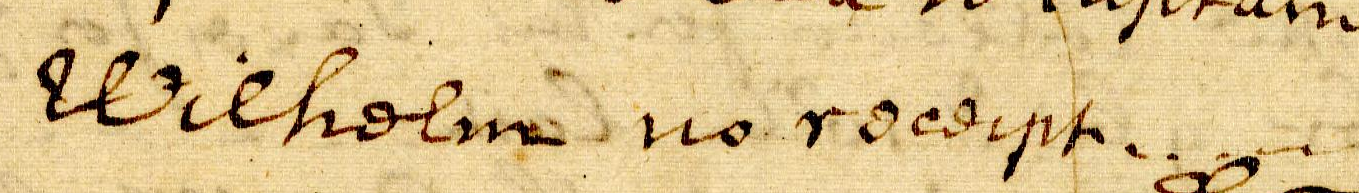Wilhelm no receipt.....
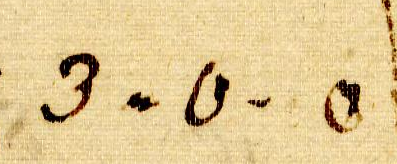3.0.0
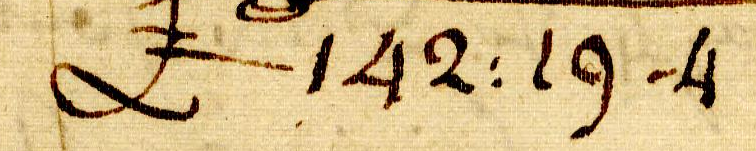£ 142:19.4
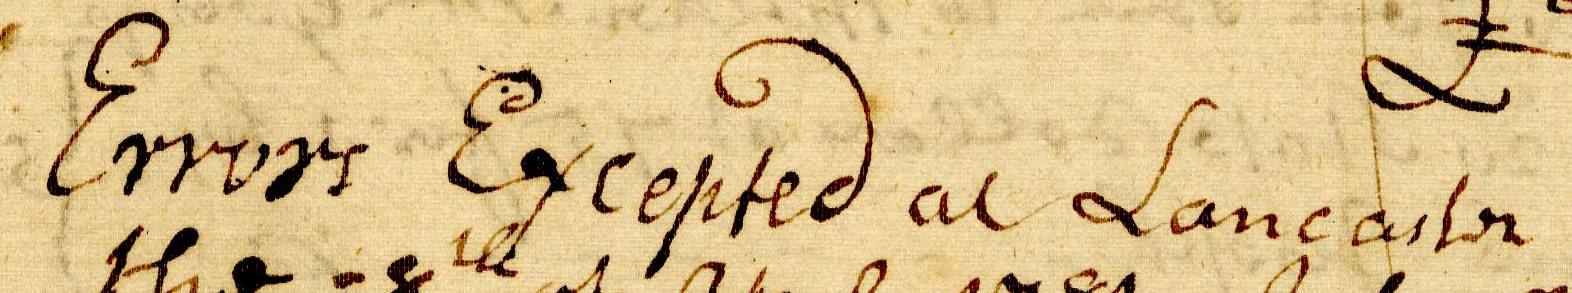Errors Excepted at Lancaster
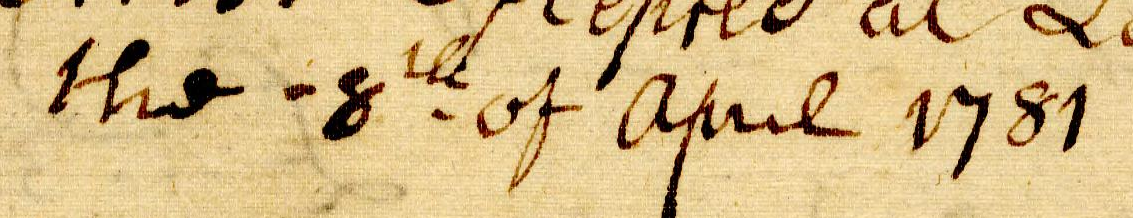the 8^th. of April 1781
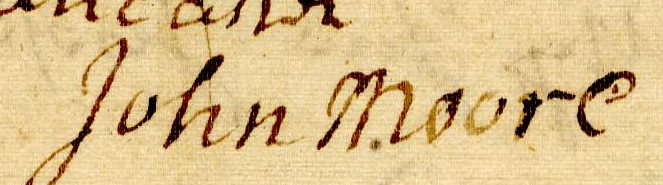John Moore
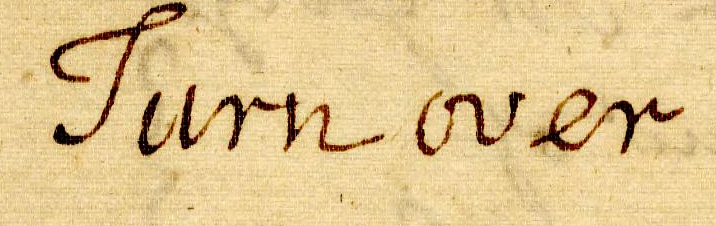Turn over
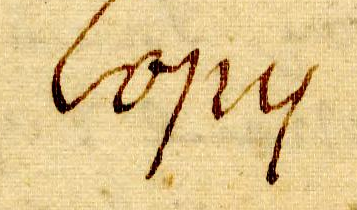Copy
